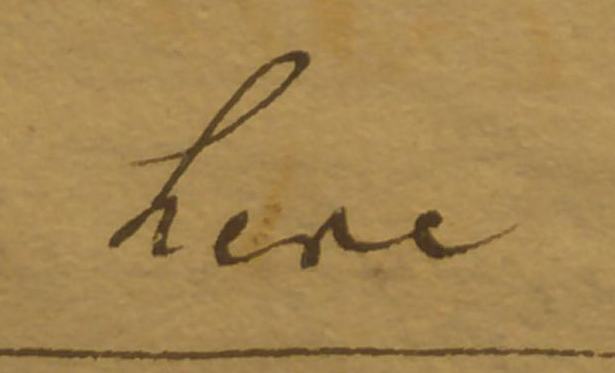here
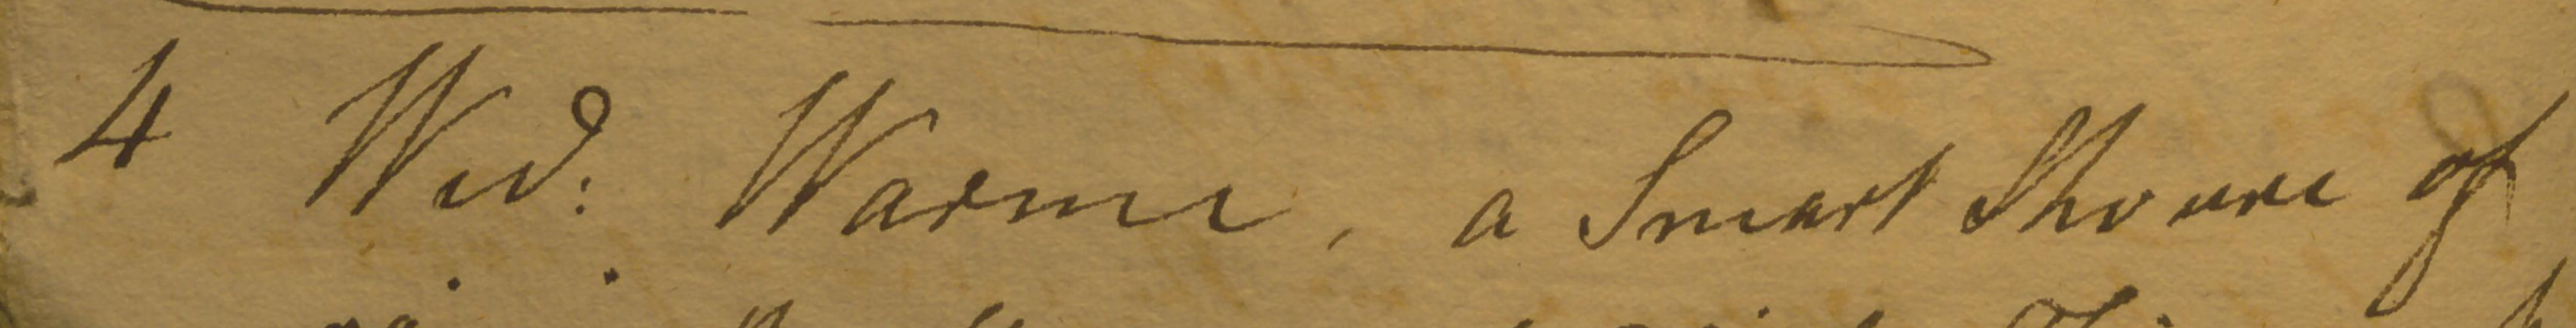4 Wed. Warme, a Smart Shoure of
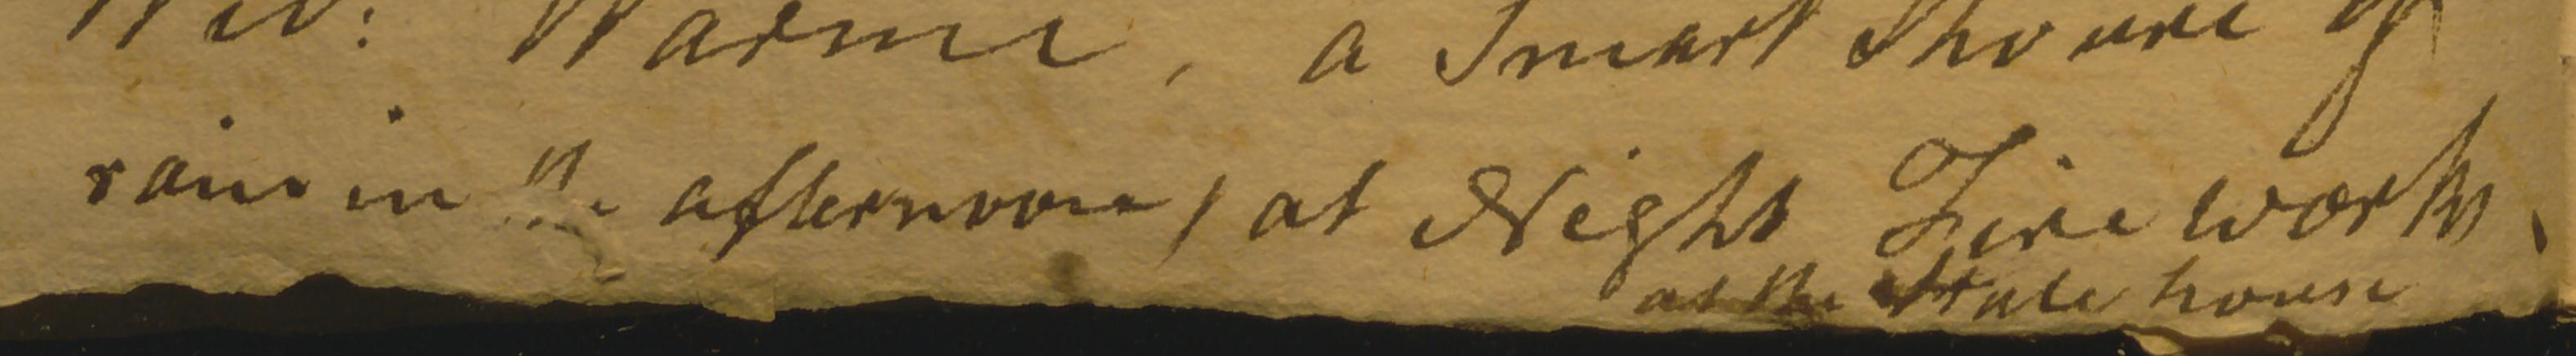rain in to afternoon / at Night, Fire works
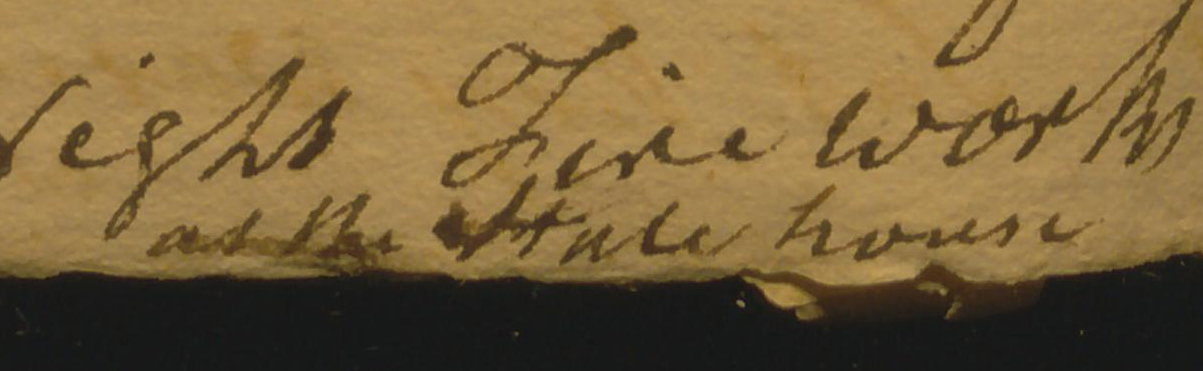at the state house
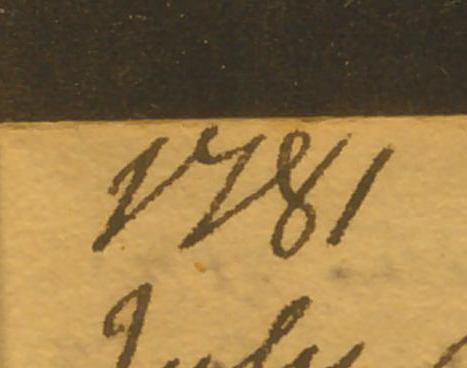1781
